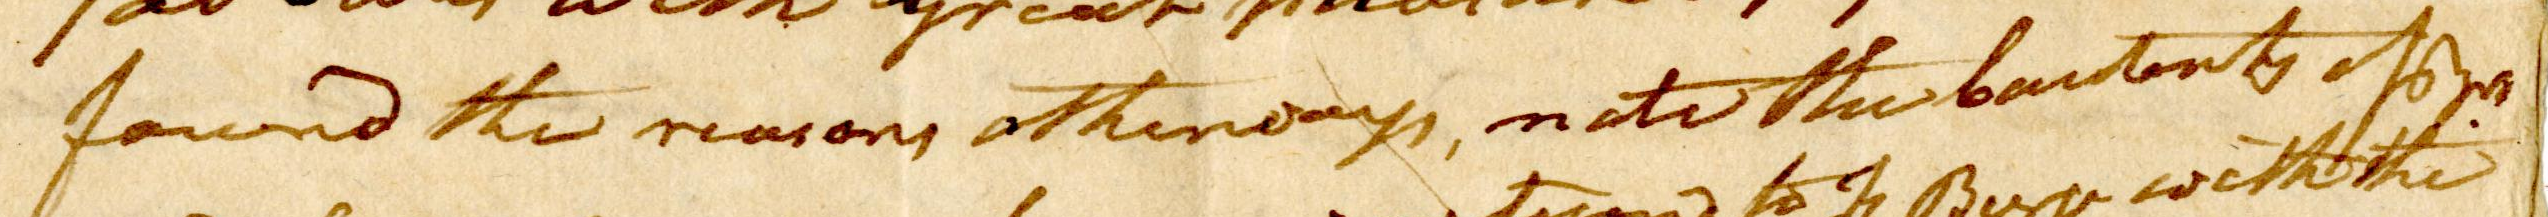found the reasons otherways, note the Contents of yrs.
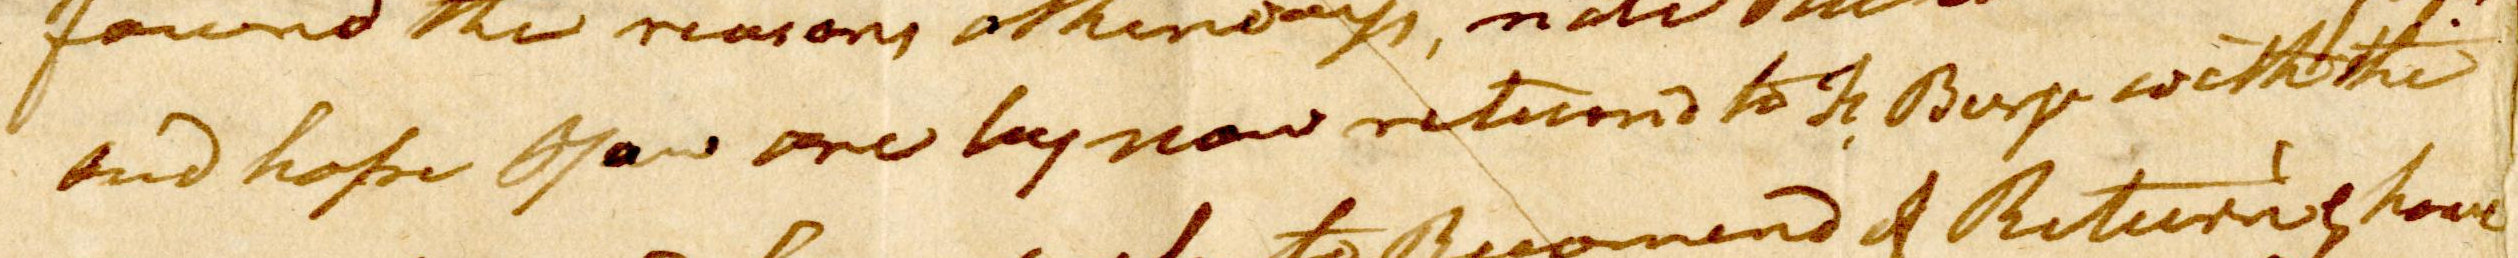and hope you are by now returnd to F Burg with the
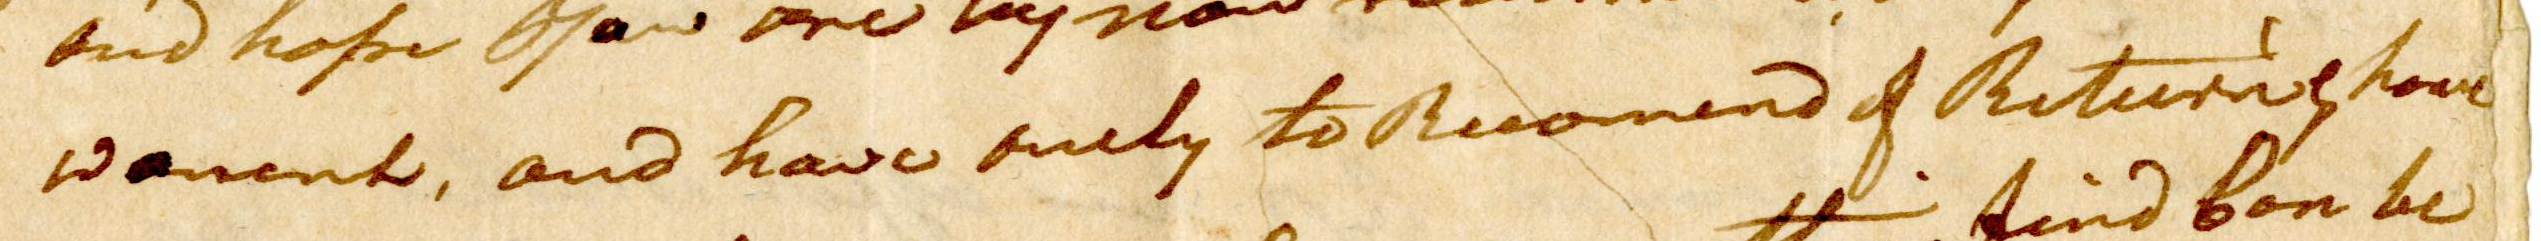warrant, and have only to Recommend of Returning home
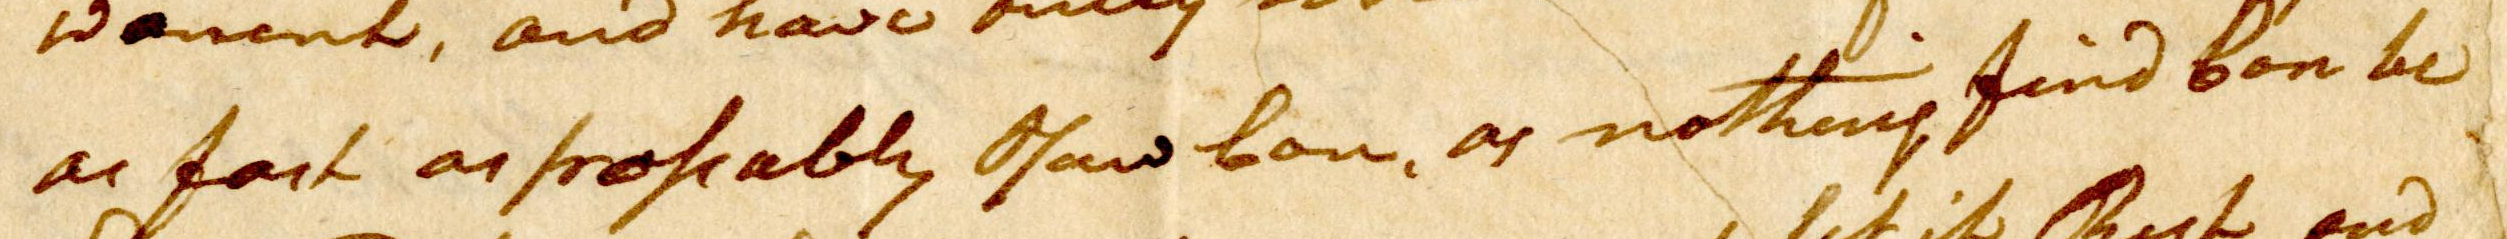as fast as possably you can, as nothing find can be
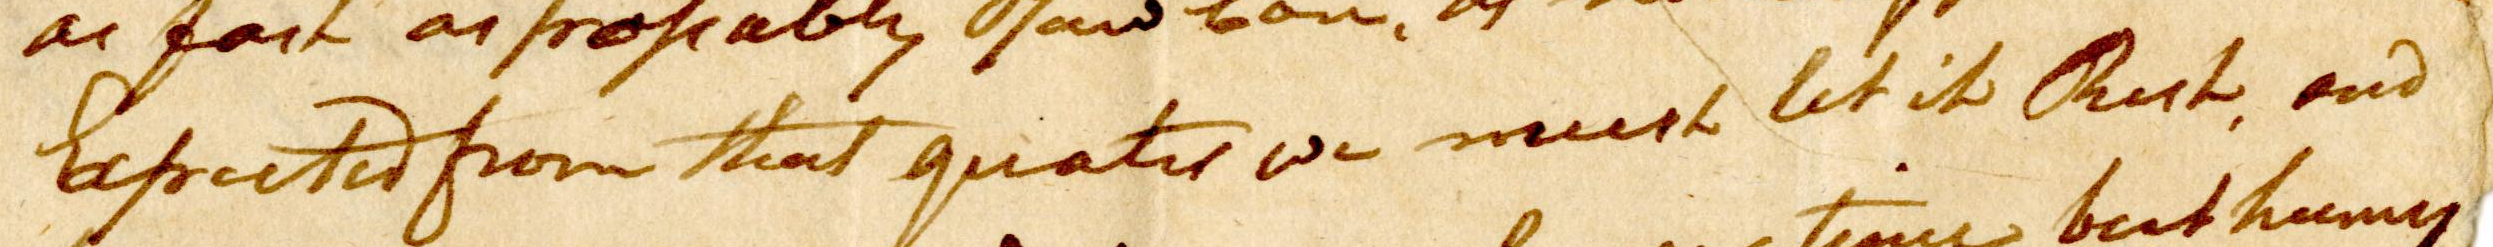Expected from that quarter we must let it Rest, and
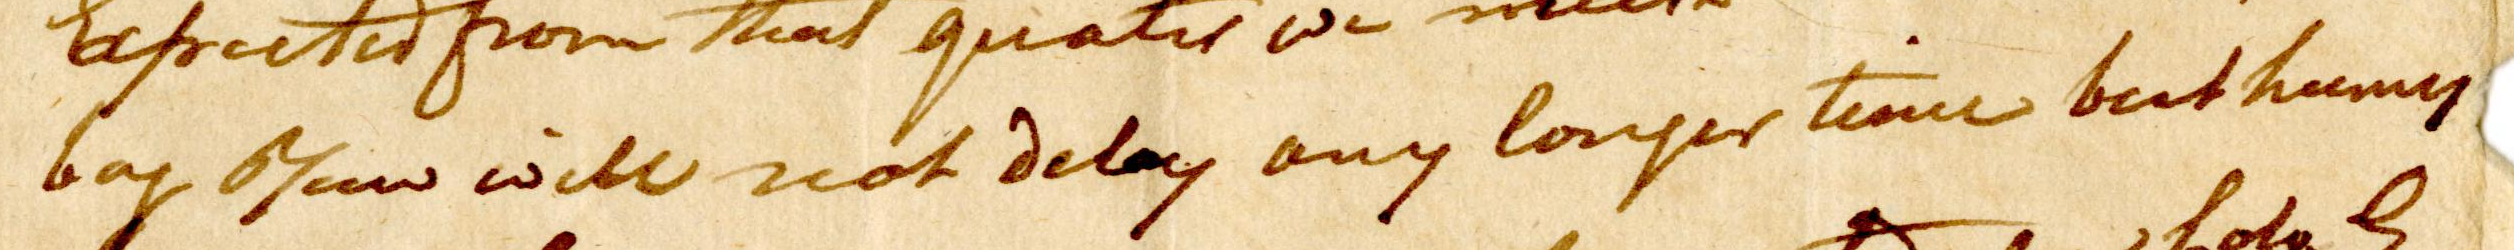say you will not delay any longer time best hurry
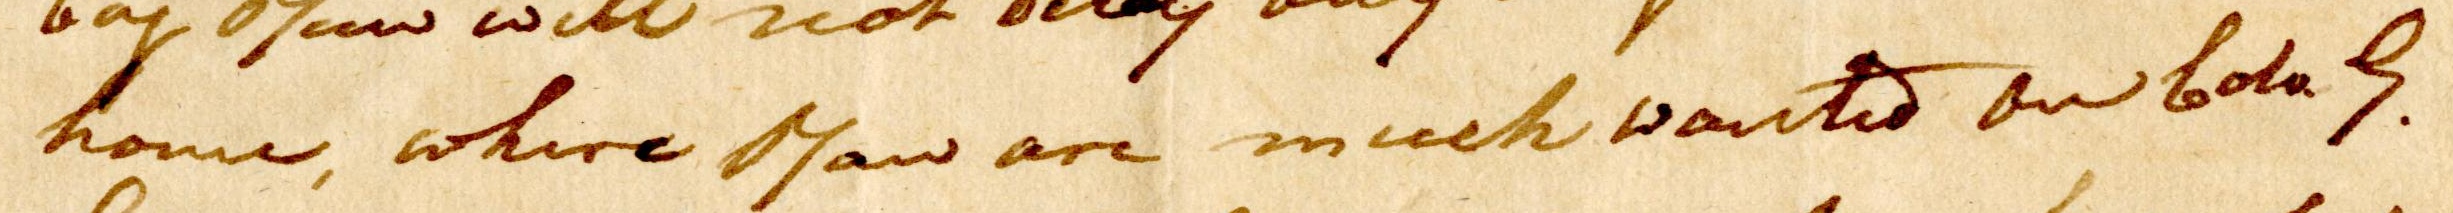home, where you are much wanted on Colo G.
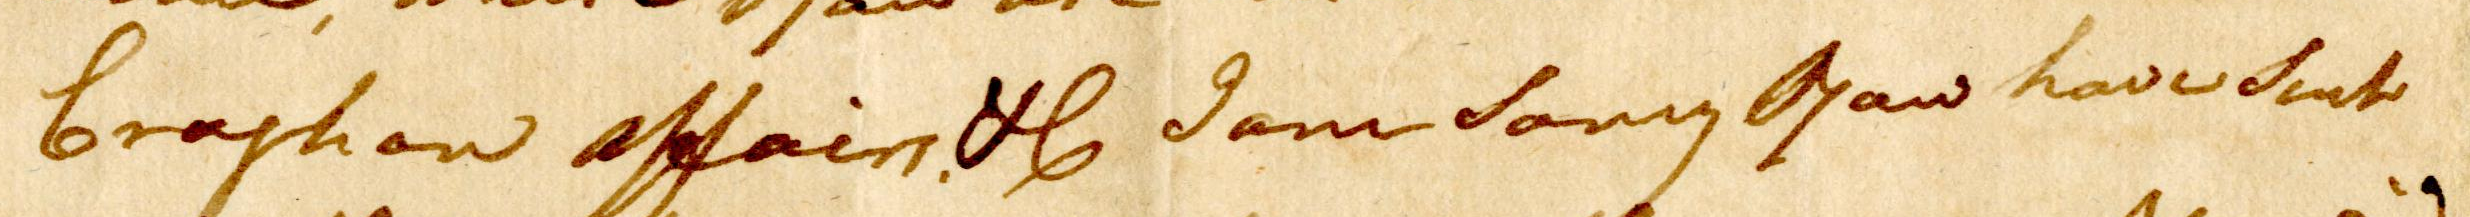Croghan affair &C I am sorry you have Sent
